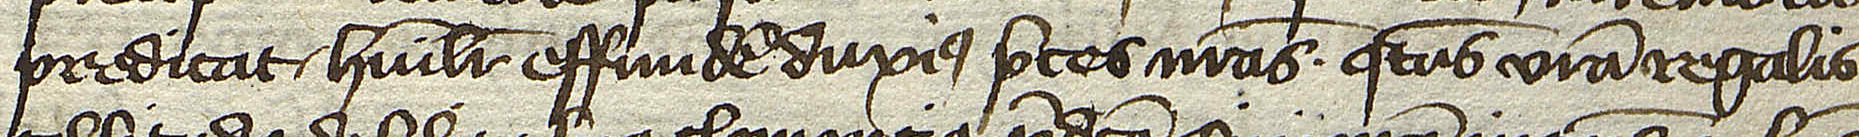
predicat / hu*il*r effunde* duxi* p*ces n*ras . q*t*us v*ra regalis
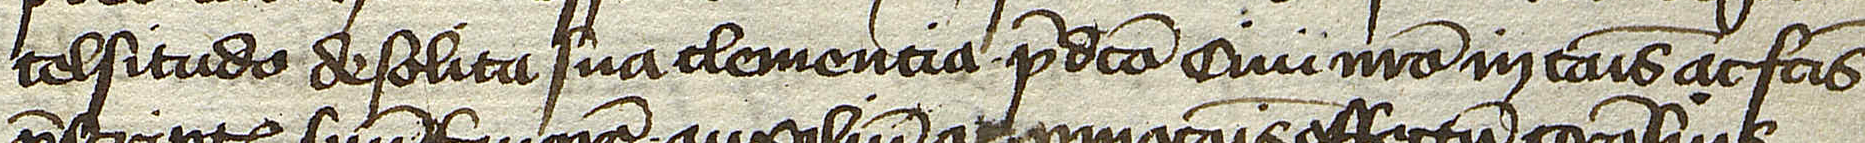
celſitudo deſolita ſua clemencia . p*dic* Ciui n*ro in ca*is ac fac*
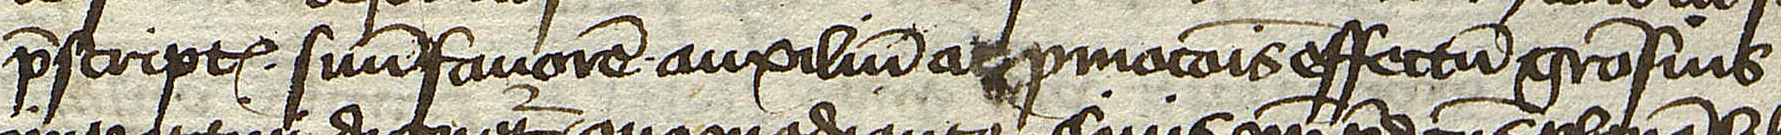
p*ſcript* . ſuu* fauore* auxiliu* ac p*mocio*is effectu* g*roſius
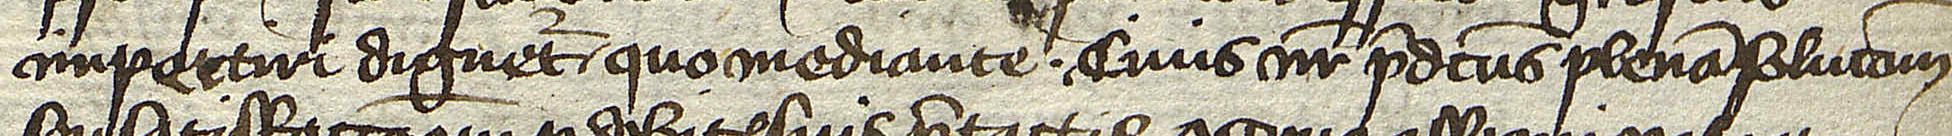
impertiri dignet* quo mediante . / Ciuis n*e p*d*tus plena* ſolucam*
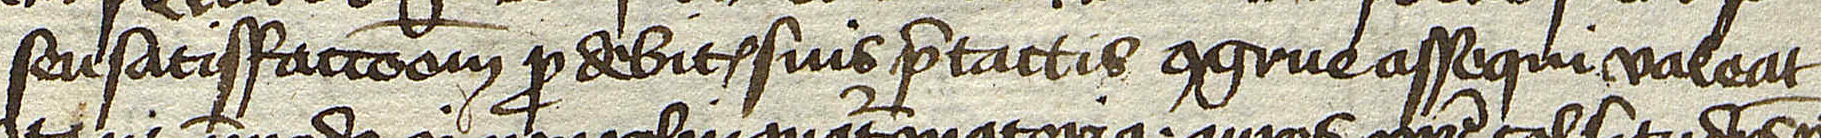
ſeu ſatiſfaccoem* p* debit* ſuis p*tactis *grue aſſequi valeat
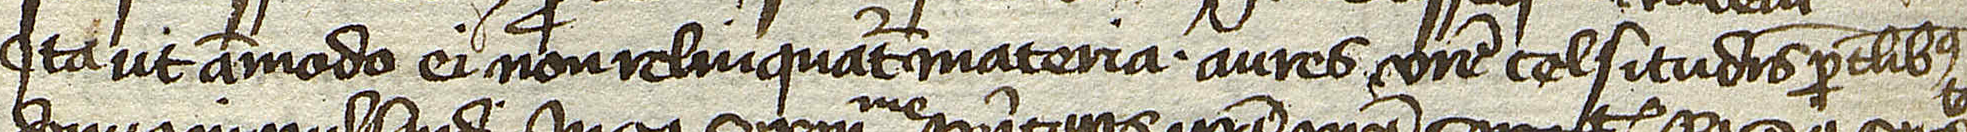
Ita ut a*modo ei non relinquat* materia . aures v*re celeſitudi*s p*tib*
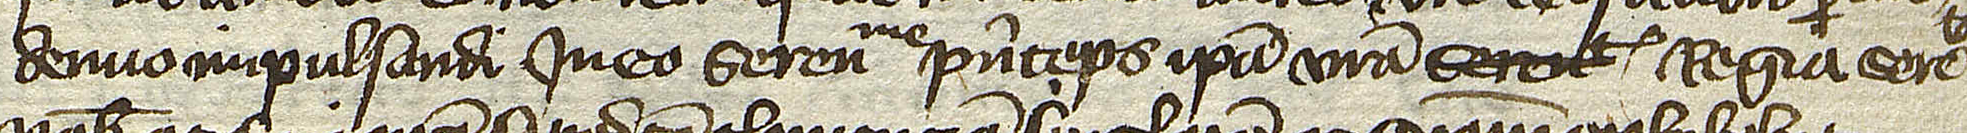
denuo impulſandi . In eo Seren* p*nceps ip*a v*ra Seren* Regia Sere*
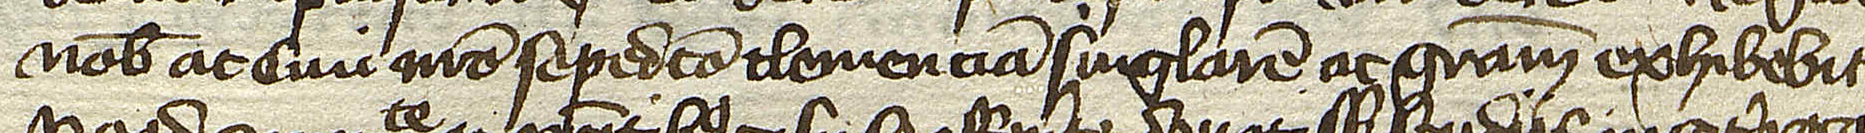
nob* ac Ciui n*ro ſepe d*to clemencia* ſing*lare* ac gr*am exhibebit
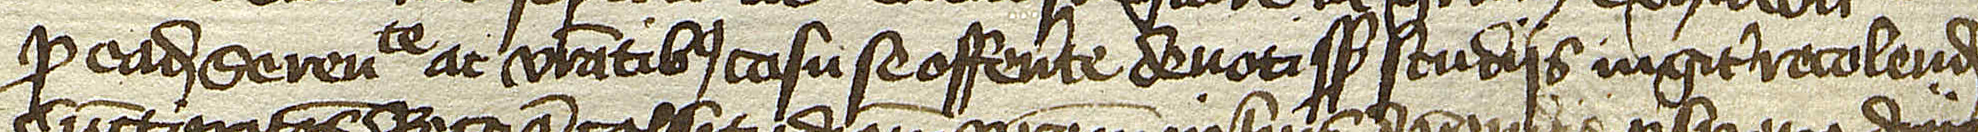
p* ead* Seren*te ac v*ratib* caſu ſe offe*nte deuotiſſ* ſtudiis iugit* recolend*
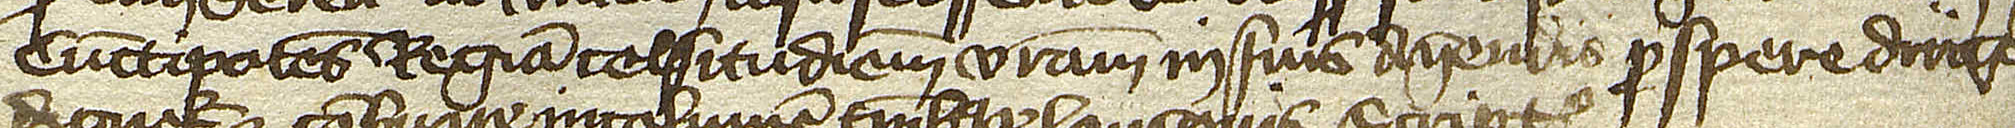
Cu*ctipote*s Regia* celſitudi*em v*ram in ſuis digendis p*ſpere dirige*
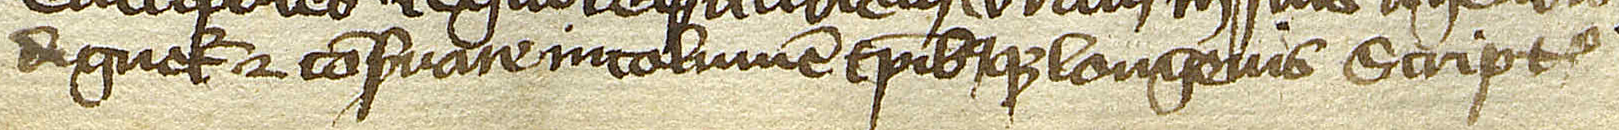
dignet* @ co*ſ*uare incolume* t*p*ib*q* longeuis Script*
